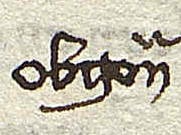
obgen*
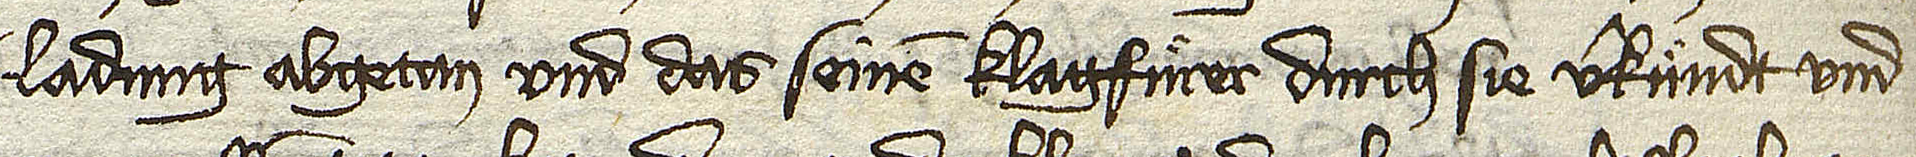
ladung abgetan vnd das ſeine* klagfürer durch ſie v*kündt vnd
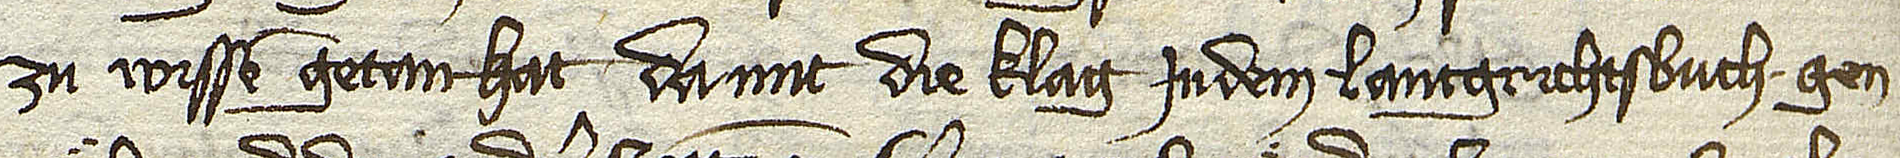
ʒu wiſſe* getan hat . damit die klag In dem lantgrichtſbuch . gen
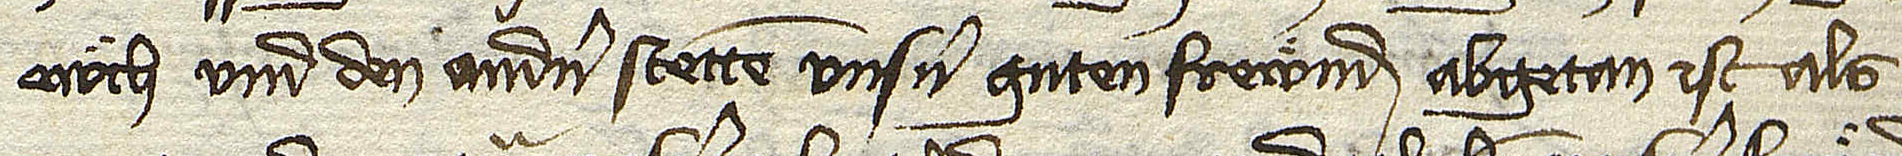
ewch vnd den and*n ſtette* vnſ*n guten frewnd* abgetan iſt als
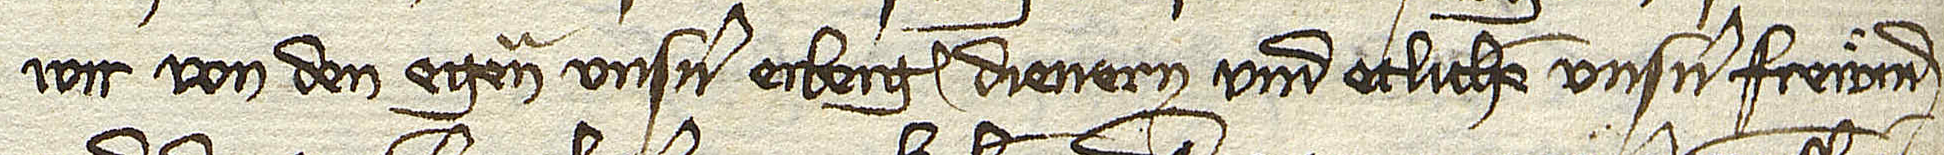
wir von den egen* vnſ*n erberg* dienern vnd etliche* vnſ*n frewnd*
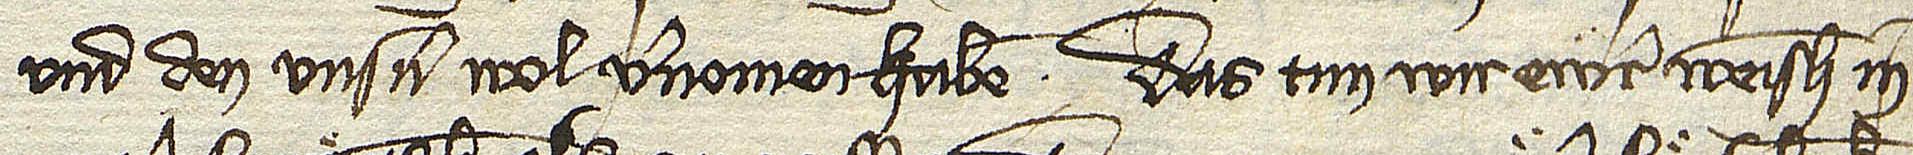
vnd den vnſ*n wol v*nomen habe* . Das tun wir ewr* weiſh* in
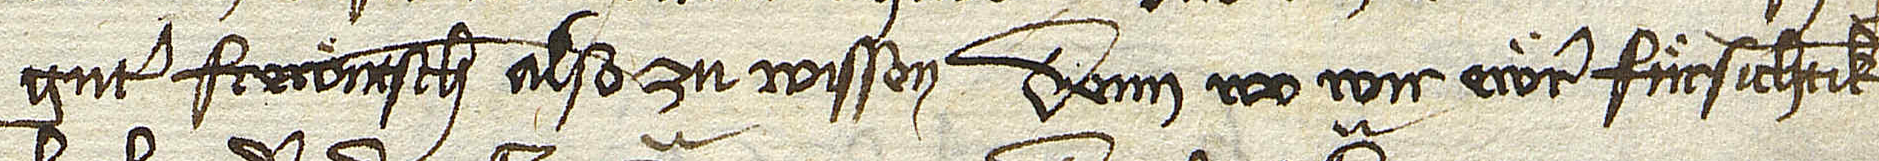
gut* frewntſch* alſo ʒu wiſſen Denn wo wir ewr* fürſichtik*
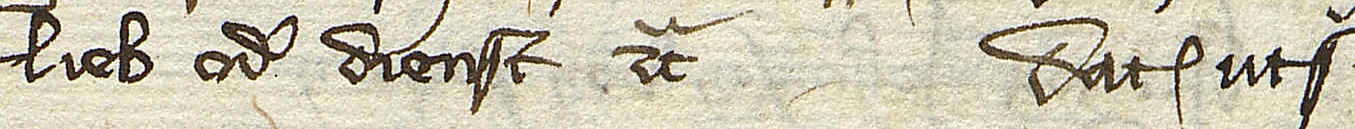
lieb od* dienſt ec* / Dat* ut ſ*
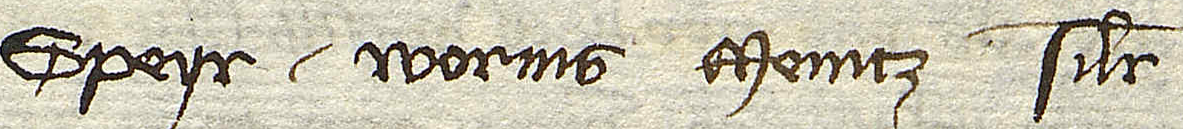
Speyr / Worms Meincʒ ſilr*
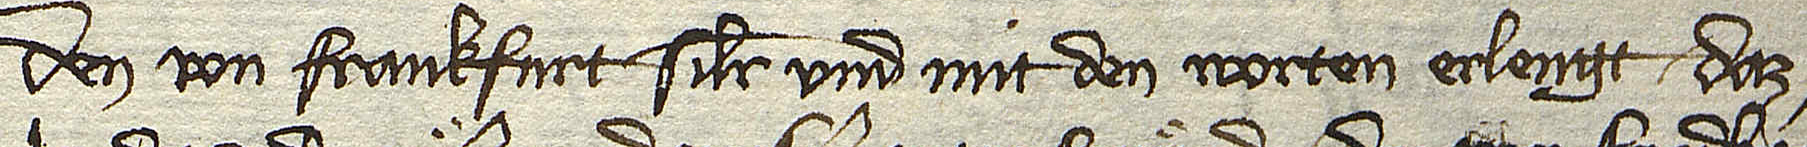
Den von frankfurt ſilr* vnd mit den worten erlengt / daʒ
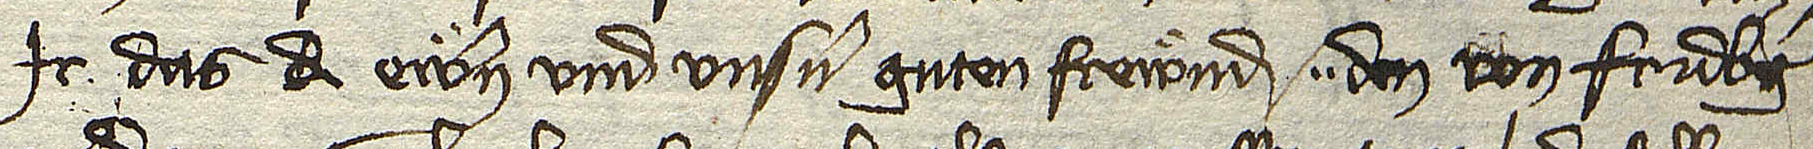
Ir das d ew*n vnd vnſ*n guten frewnd* ~ den von fridb*g
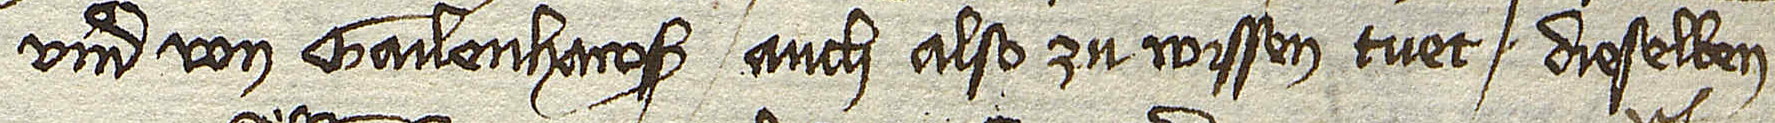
vnd von Gailenhawſ* auch alſo ʒu wiſſen tuet / . dieſelben
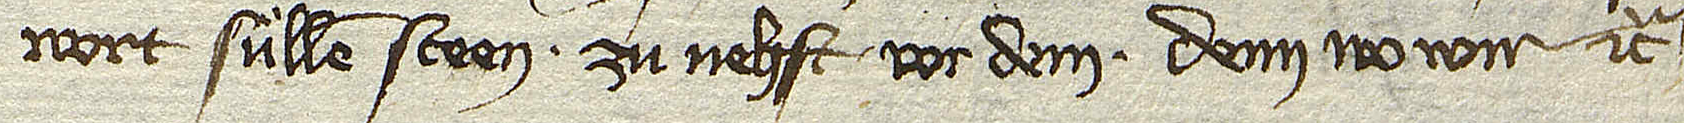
wort ſülle* ſteen . ʒu nehſt / vor dem . Denn wo wir ec*
